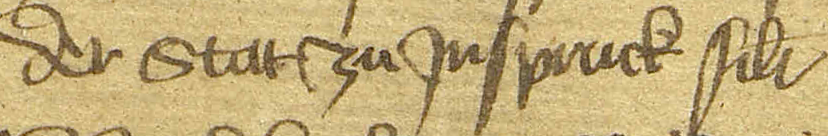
Der Stat cʒu Inſpruck ſilr*
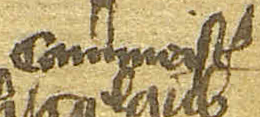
Cam*meiſt*
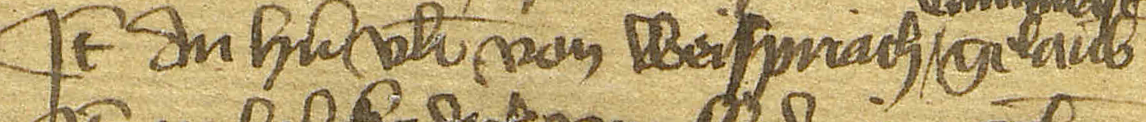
It* An hn* vlr* von Weiſpriach gelaub*
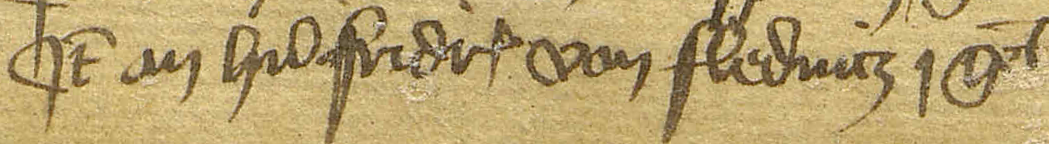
It* an hn* fridr* von flednicʒ i gel*
